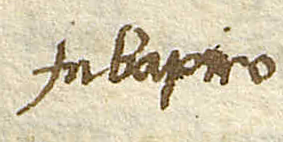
In bapiro
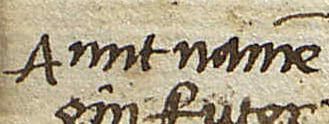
mit name*
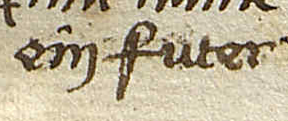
ein futer
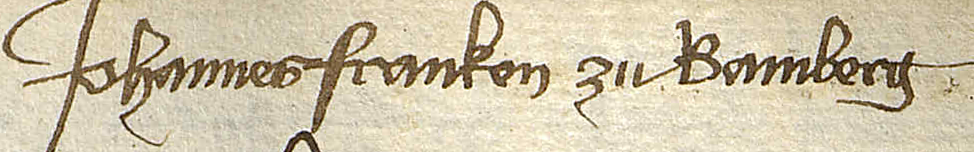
Iohannes franken ʒu Bamber
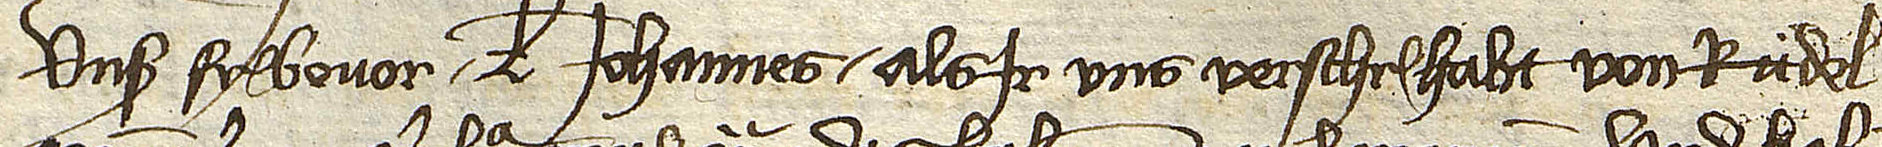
Vnſ* fr* beuor / L* Iohannes / als Ir vns verſchr* habt von Rüdel
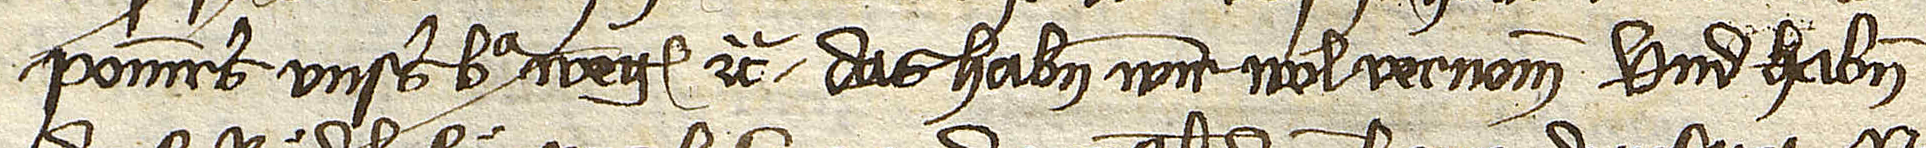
Pomr*s* vnſs* b* weg* ec* / das habn* wir wol vernom* Vnd habn*
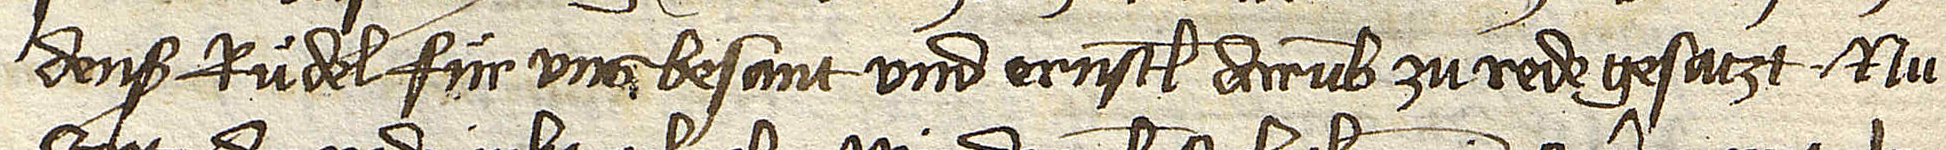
denſ* Rüdel für vns beſant vnd ernſtl* darub* ʒu rede geſacʒt . Nu
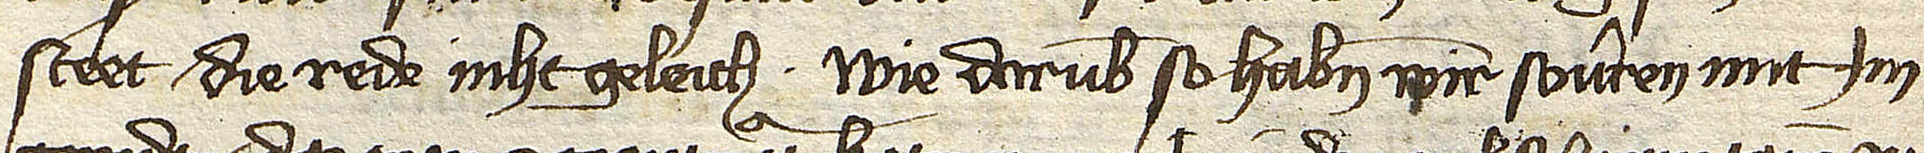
ſteet / die rede niht geleich . wie darub* ſo habn* wir ſou*ren mit Im
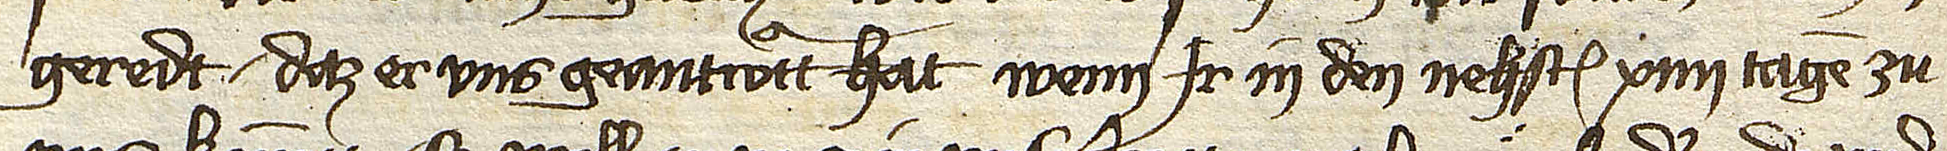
geredt / daʒ er vns geantw*tt hat wenn Ir in den nehſt* xiiii tage* ʒu
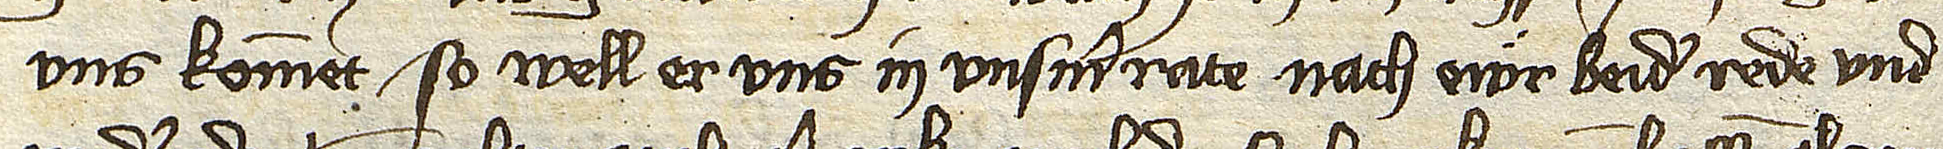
vns kom*et / ſo well er vns in vnſm* rate nach ewr beid* rede vnd
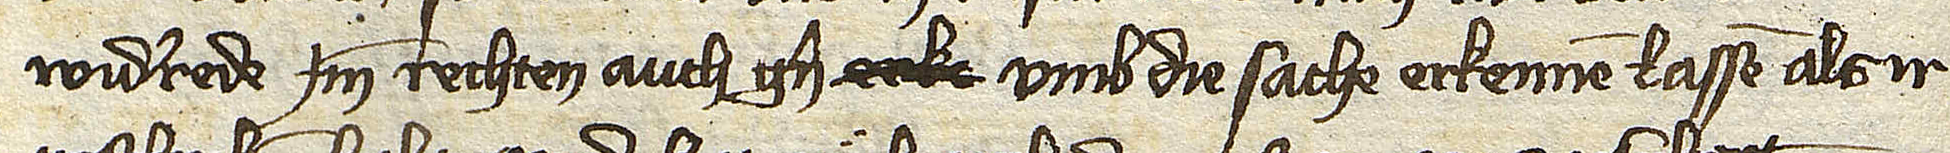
wid*rede Im rechten auch g*n erke vmb die ſache erkenne* laſſe* als ir
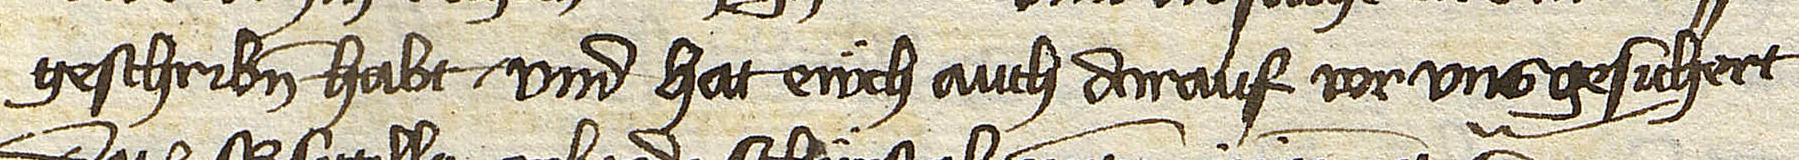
geſchribn* habt / vnd hat ewch auch darauf vor vns geſichert
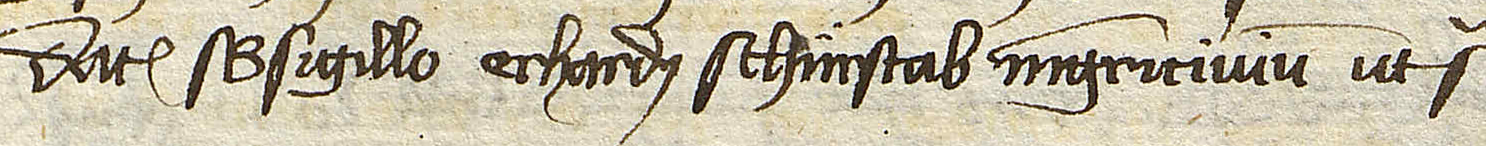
Dat* ſB ſigillo erhardi ſchürſtab mgri*ciuiu* ut ſ*
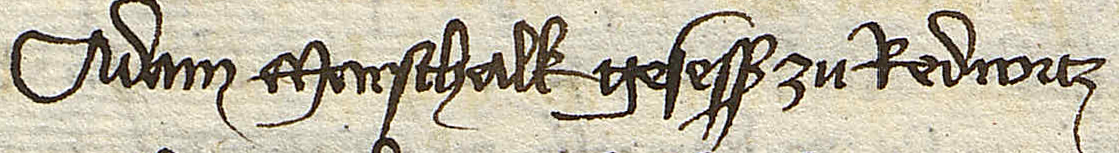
Adam Marſchalk geſeſſ* ʒu Redwicʒ
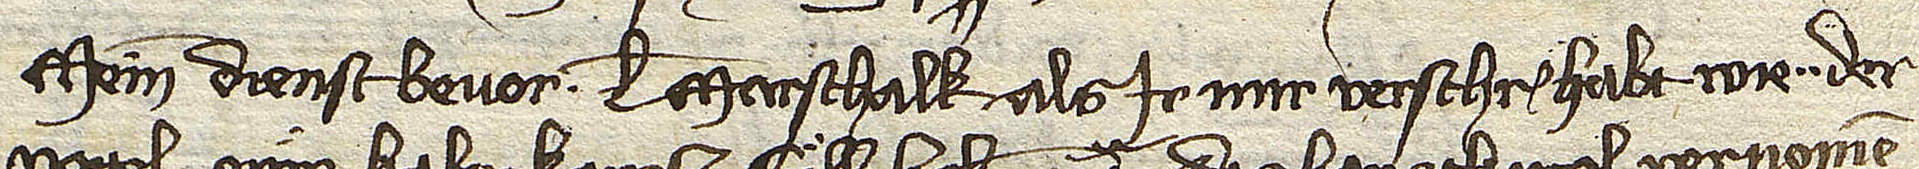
Mein* dienſt beuor . L* Marſchalk / als Ir mir verſchr* habt wie ~ der
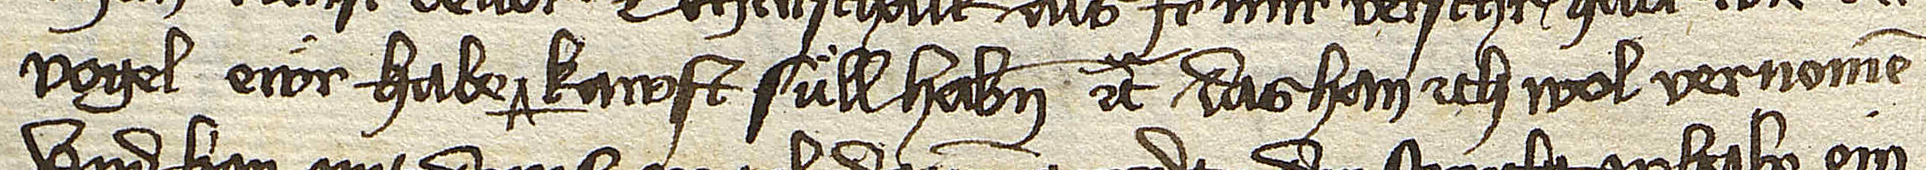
vogel ewr habe kawft ſüll habn* ec* / das han ich wol vernome*
